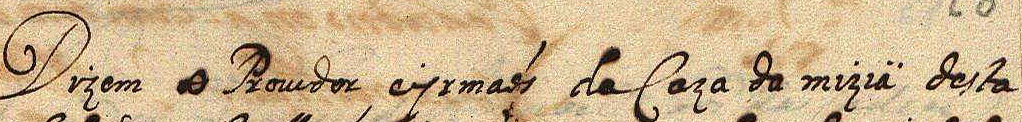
Dizem o Prouedor, e jrmaõs da Caza da miziā desta
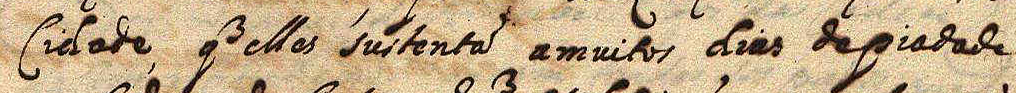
Cidade, q̄ elles sustentaõ a muitos dias de piadade
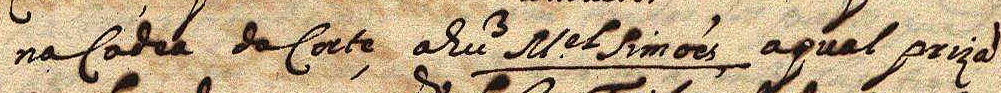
na Cadea da Corte, a hū M.el Simoẽs, a qual prizaõ
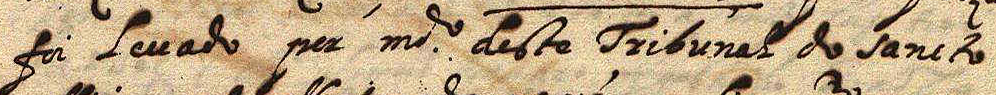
foi leuado per md.o deste Tribunal do sancto
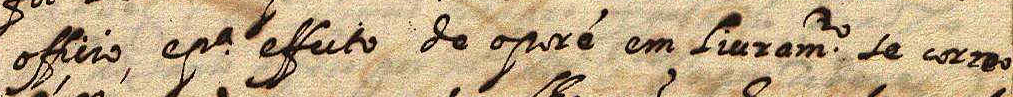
offiçio, e p.a effeito de o porē em Liuram.to se correo
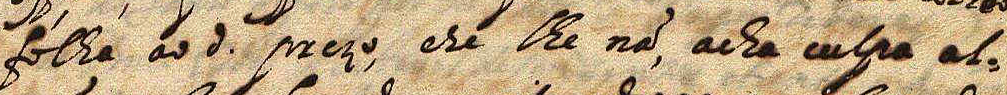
folha ao d. prezo, e se lhe naõ, acha culpa al
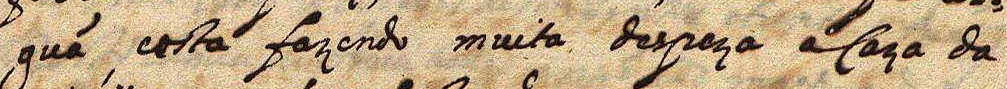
guā, e esta fazendo muita despeza a Caza da
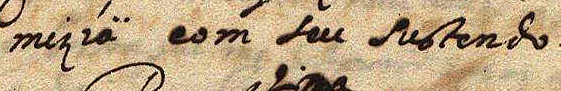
miziā com seu sustendo
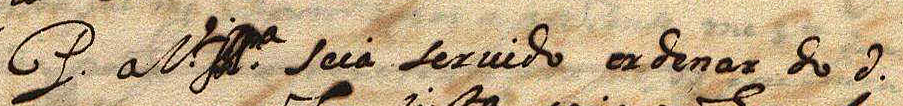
P. a V. Jllm.a seia seruido ordenar do d.
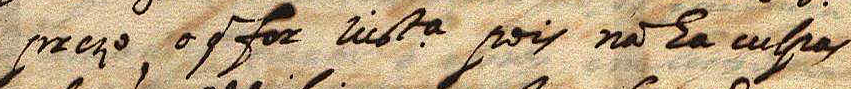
prezo o q̄ for iust.a pois naõ ha culpas
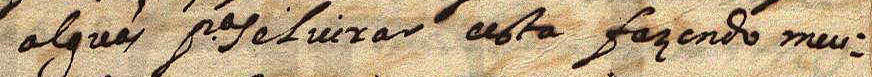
alguās p.a se liurar e esta fazendo mui
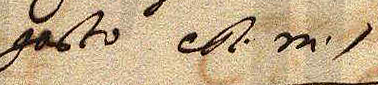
gasto e R. m. /
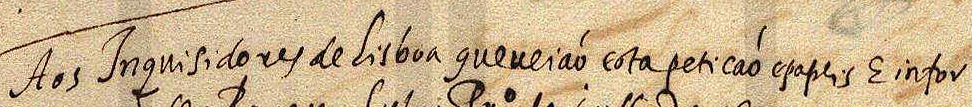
Aos Inquisidores de Lisboa que ueiaõ esta petição e papeis E infor
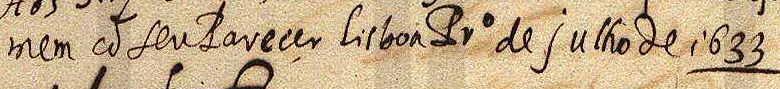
mem cō seu Parecer Lisboa Pro de julho de i633
